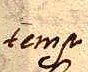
temp
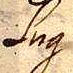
Lug
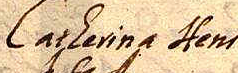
Catherina Hens̄
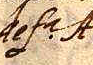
def.a A
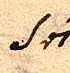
Sos̄
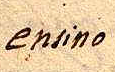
ensino
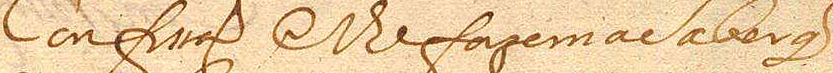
Confissā e lhe fazem a Saber q̄
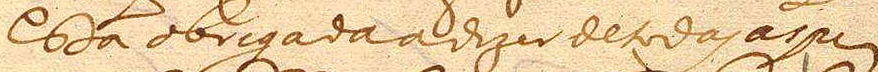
esta obrigada a dizer de todas as pe
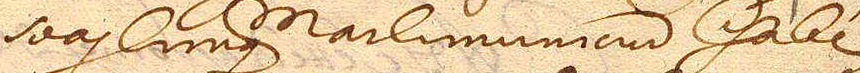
soas Com qm as comunicou e sabe
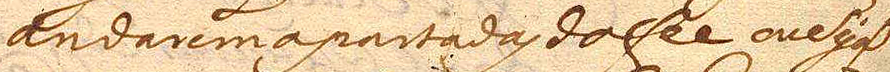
andarem apartadas da fee ou sejā
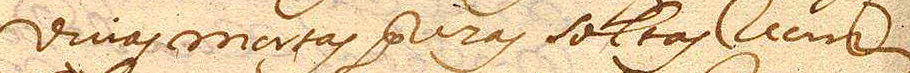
viuas mortas prezas soltas Recom
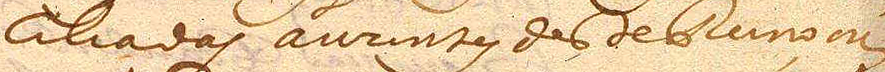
ciliadas auzentes deste Reino, ou
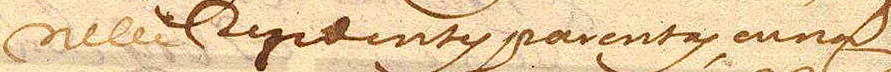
nelle Residentes parentas, ou naõ
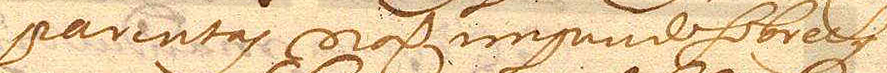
parentas nā impondo sobre sy
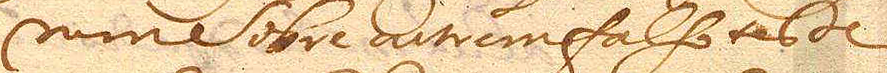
nem Sobre outrem falso teste
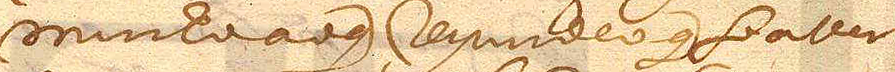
munho ao q̄ Respondeo q̄ so a ver
